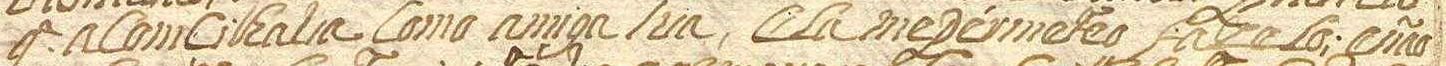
q̄ aComcilhava como amiga sua, ela me permeteo fazelo; e não
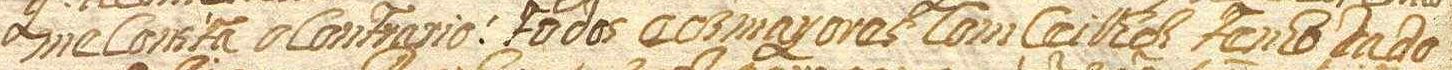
me Consta o Contrario: todos e os mayores ComCeilhos tenho dado
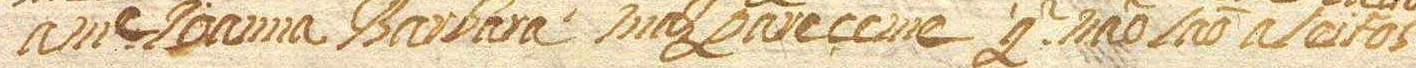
a m.e Ioanna Barbara. mas pareceme q̄ naõ saõ aseitos
